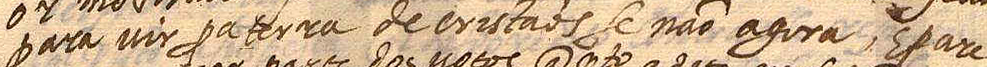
para uir ꝑa terra de cristaõs senaõ agora, E pare
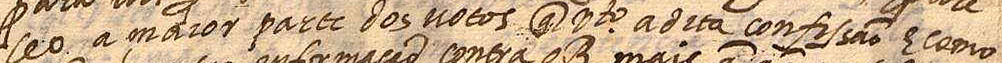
ceo a maior parte dos uotos q̄ v.to a dita confissão E como
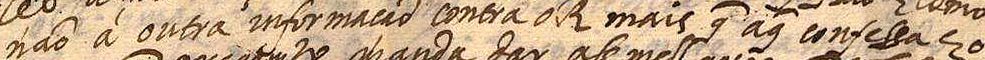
não á outra informaçaõ contra o R mais q̄ a q̄ confessa E o
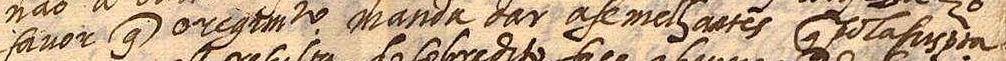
fauor q̄ o regimto manda dar a semelhantes q̄ pola susp.ta
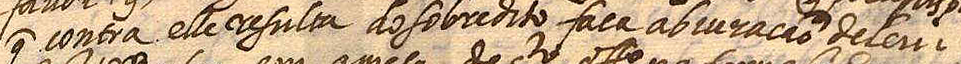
q̄ contra elle resulta do sobredito faça abiuração de leui
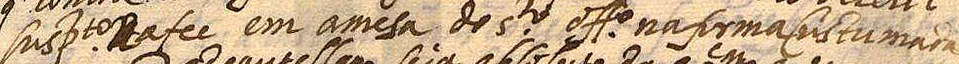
susp.to na fee em a mesa do s.to off.o na forma Custumada
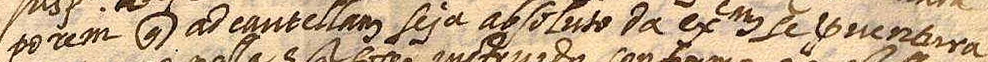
porem q̄ ad cautellam seja absoluto da excam se p̄uentura
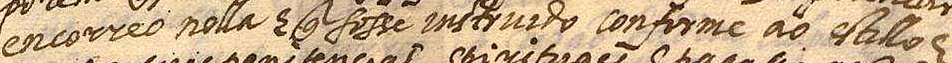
encorreo nella E q̄ fosse instruido conforme ao estillo E
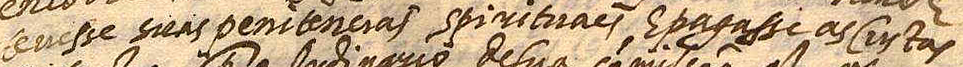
teuesse suas penitencias spirituaes, E pagasse as Custas
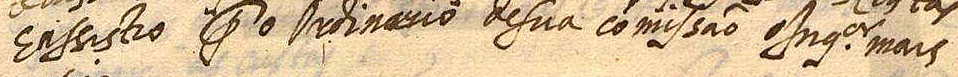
E assistio p̄ o Ordinario de sua cōmissaõ o Jnq.or mais
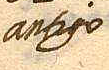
antigo
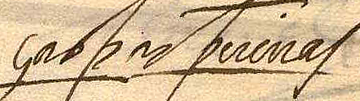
Gaspar pereira
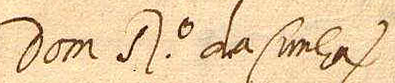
Dom R.o da Cunha
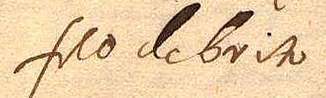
frco de brito
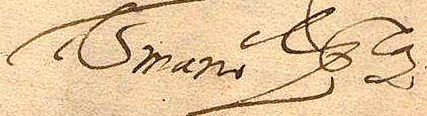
dō manoel pra.
